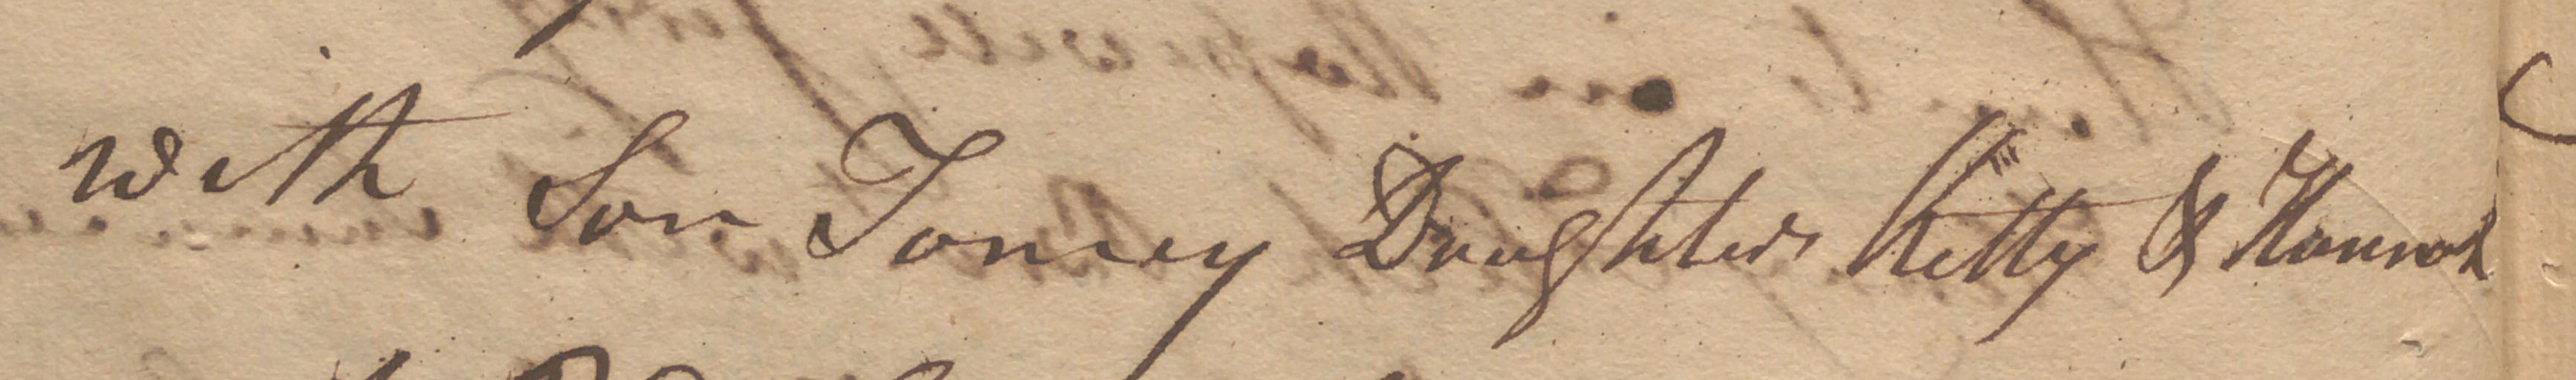with Son Tomey Daughter Kitty & Hannah
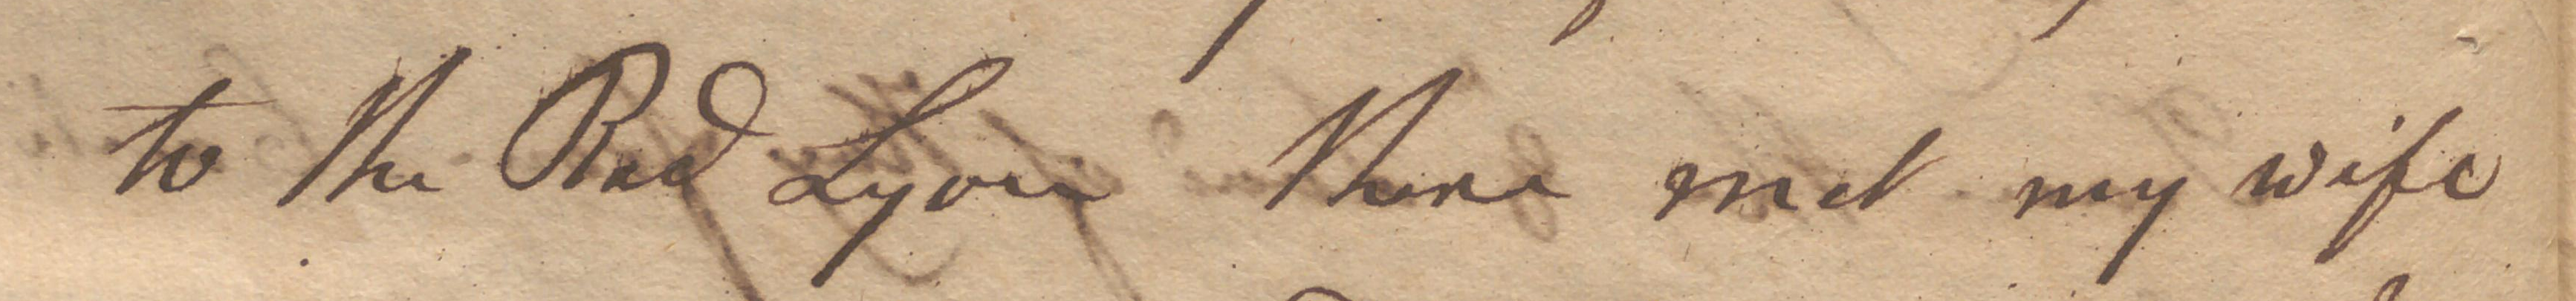to the Red Lyon there met my wife
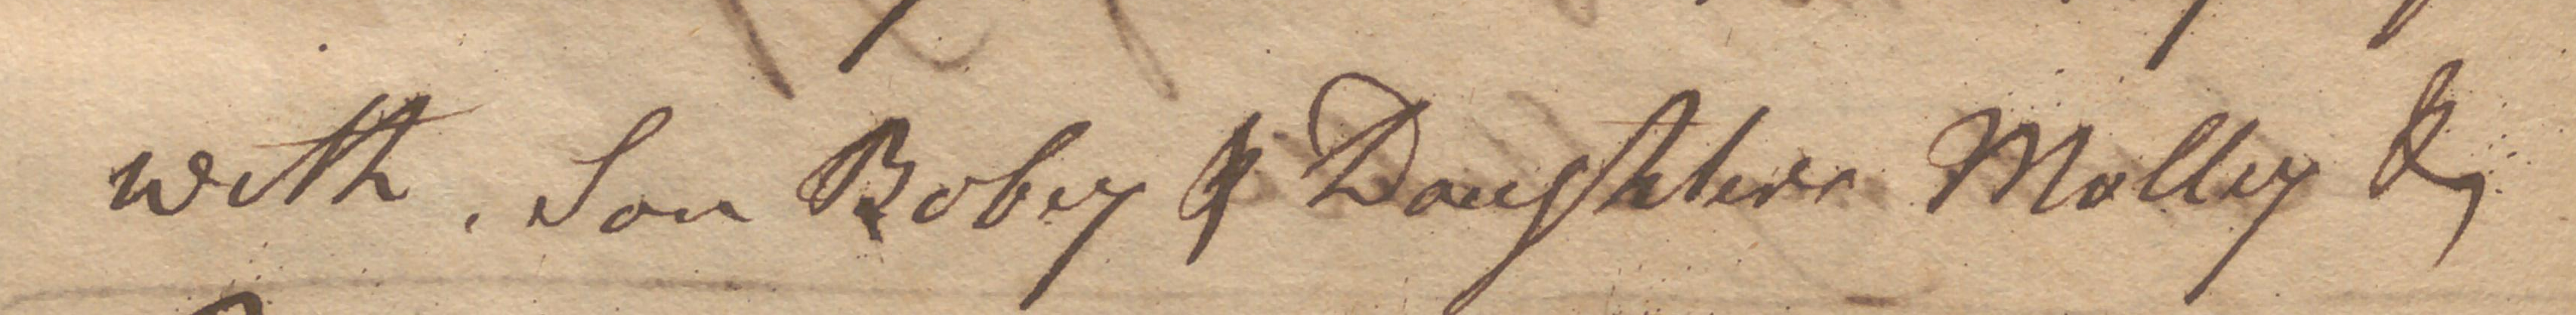with, Son Bobey & Daughters Molly &
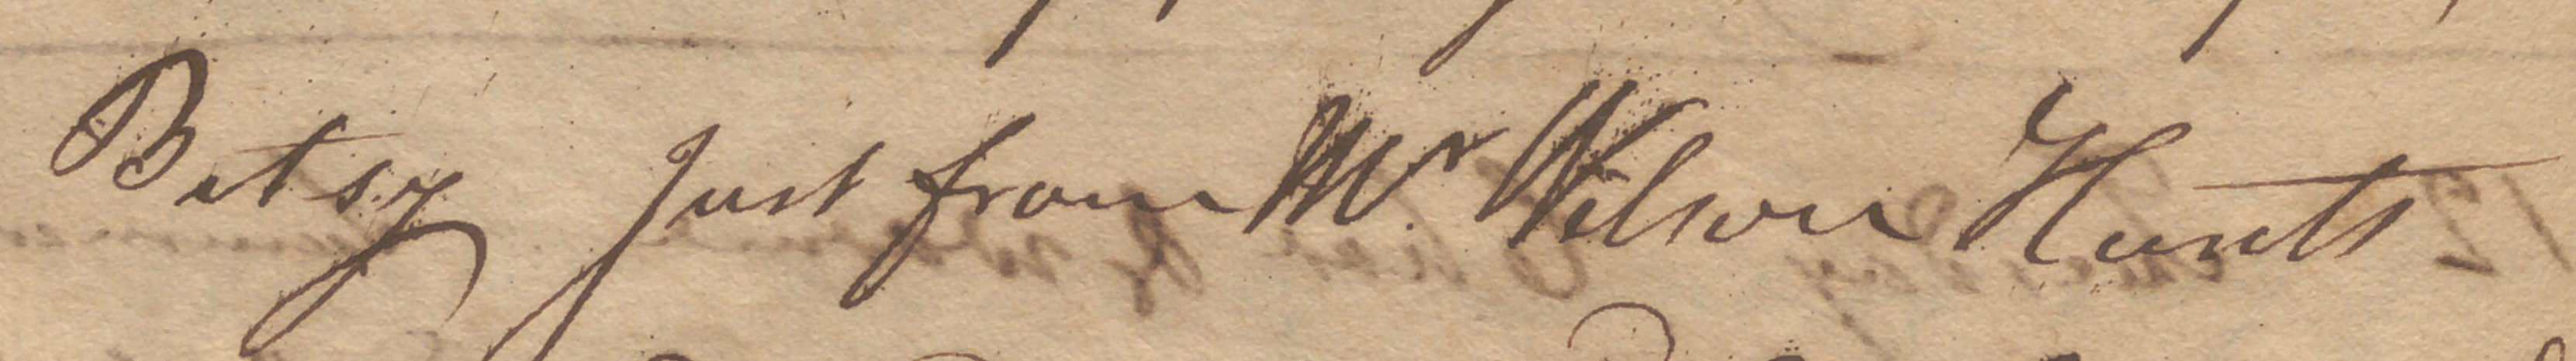Betsy Just from M^r. Wilson Hunts-
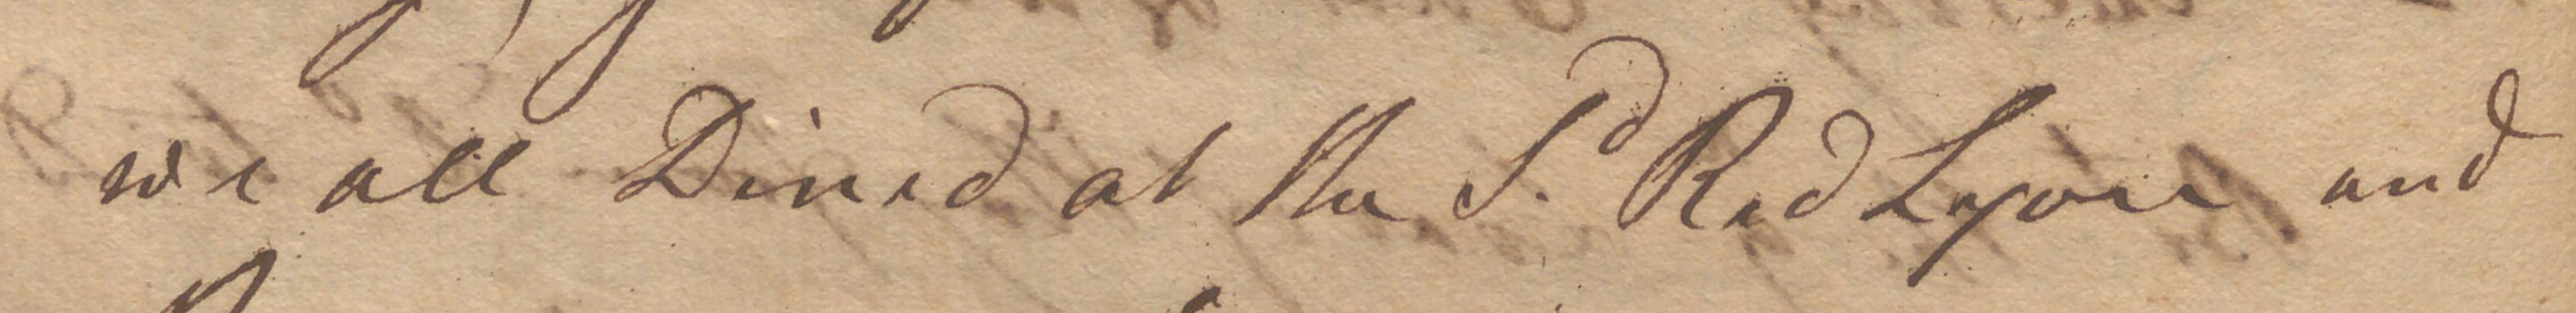we all Dined at the s^d. Red Lyon and
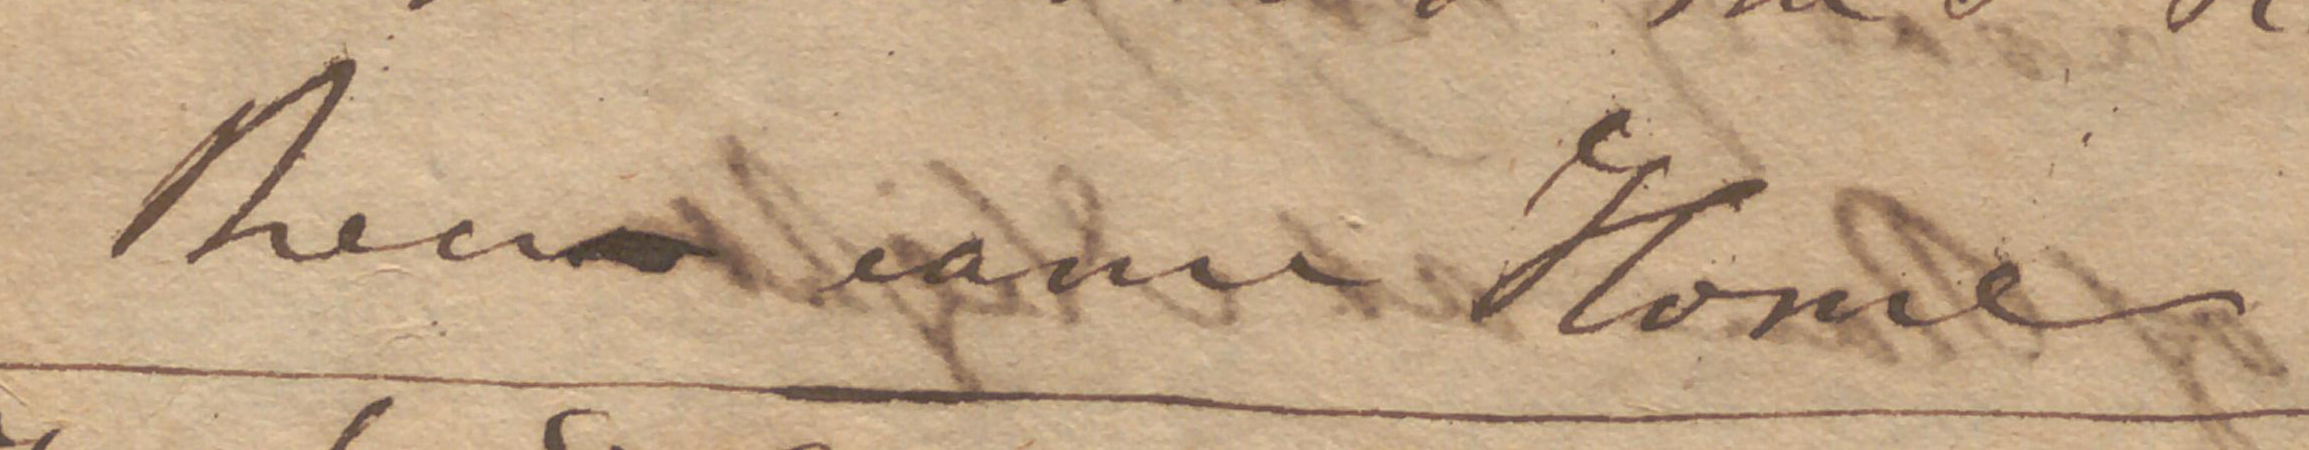then came Home
